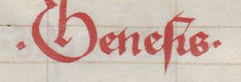.Geneſis.
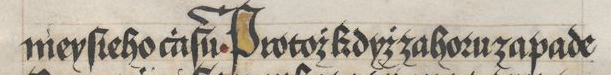nieyſieho ċaſu.Protoż kdyż zahoru zapade
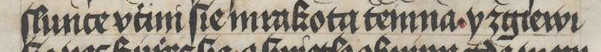ſlunce vċini ſie mrakota temna.y zgiewi
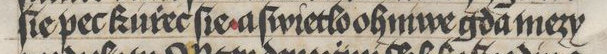ſie pec kuṙec ſie.a ſwietlo ohniwe gda mezy
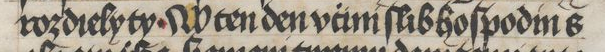rozdiely ty.Wten den vċini ſlib hoſpodin s
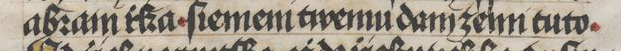abram ṙka.ſiemem twemu dam zemi tuto.
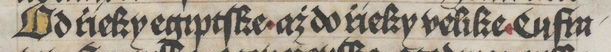Od ṙieky egiptſke.aż do ṙieky velike.eufra¬
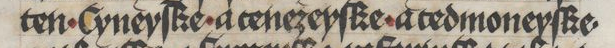ten.Cyneyſké.a cenezeyſke.a tedmoneyſke.
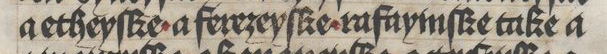a etheyſke.a ferezeyſke.rafaymſke take a
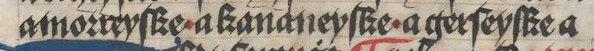amozreyſke.a kananeyſke.a gerſeyſke a
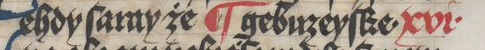Eehdy ſaray że gebuzeyſke.xvi.
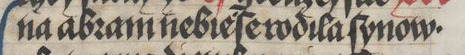na abram nebieẛe rodila ſynow.
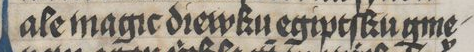ale magic diewku egiptſku gme¬
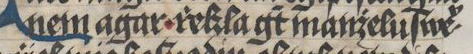vieui agar.ṙekla ḡt manżelu ſwev
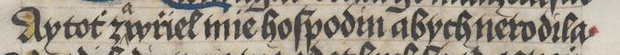Ay toṫ zawṙiel mie hoſpodin abych nerodila.
